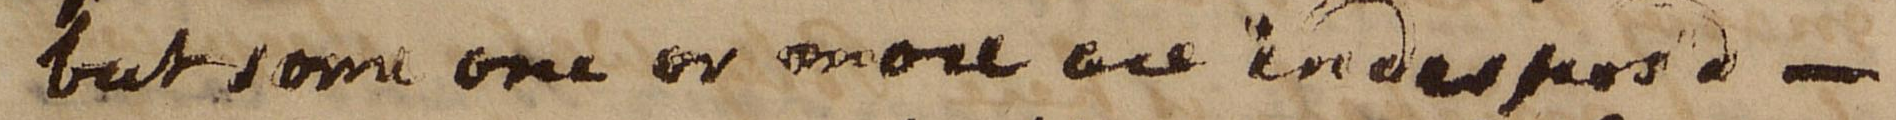but some one or more are indespos'd-
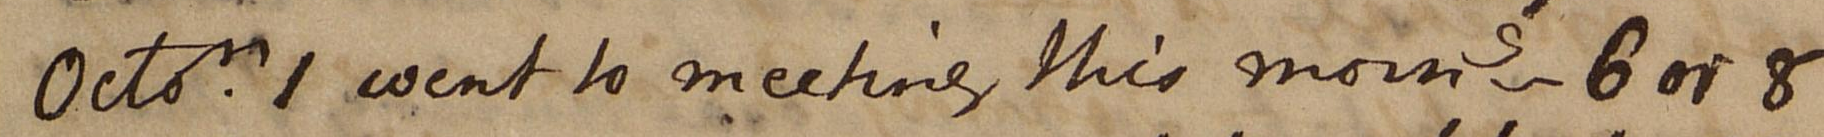Octo^r. 1 went to meeting this morn^g- 6 or 8
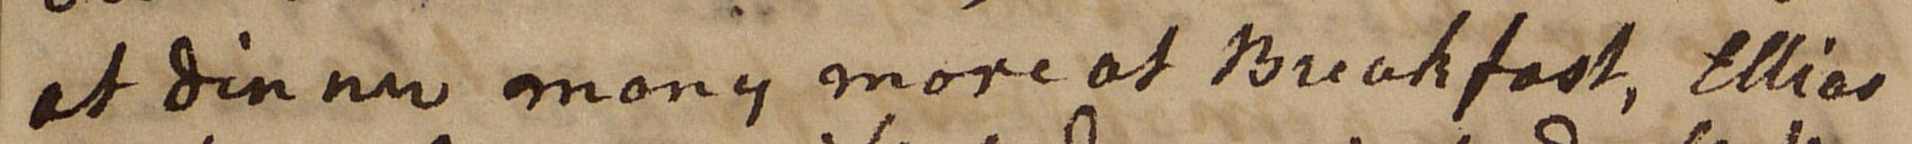at dinner many more at Breakfast, Ellias
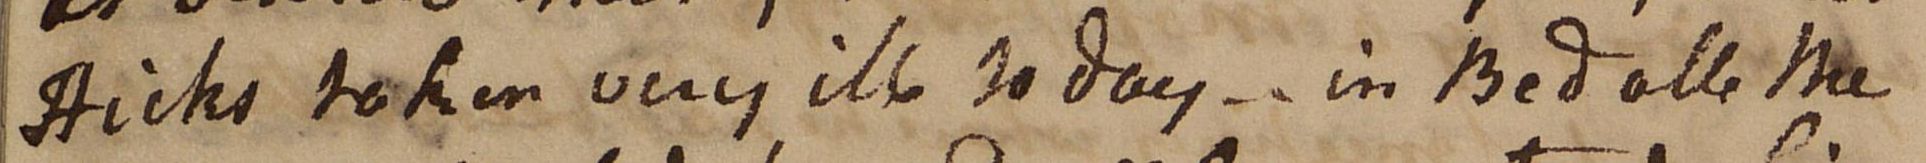Hicks taken very ill to day- in Bed alle the
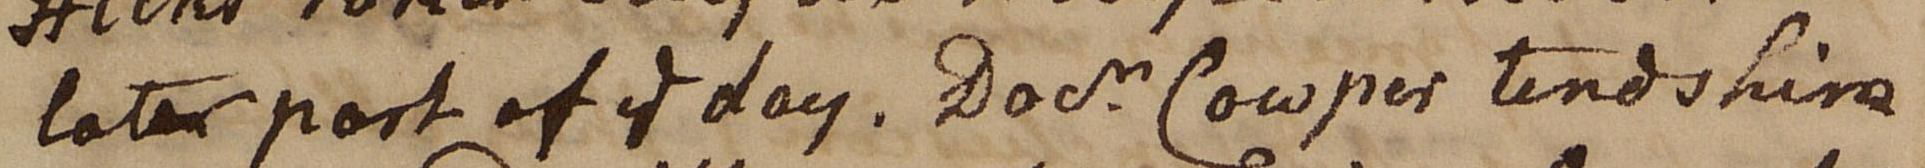later part of y^e day. Doc^r. Cowper tends him
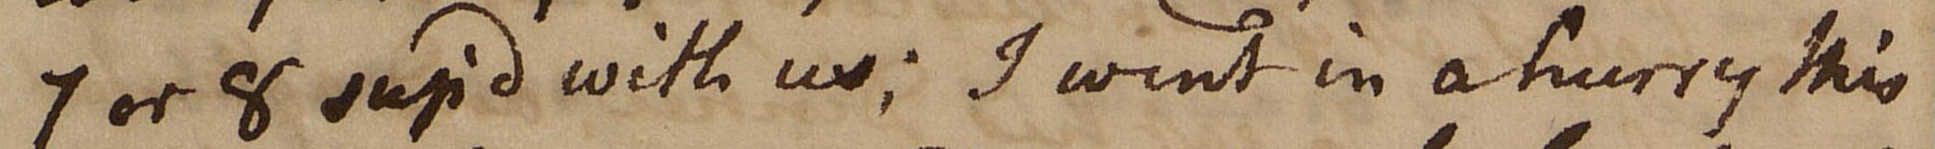7 or 8 sup'd with us; I went in a hurry this
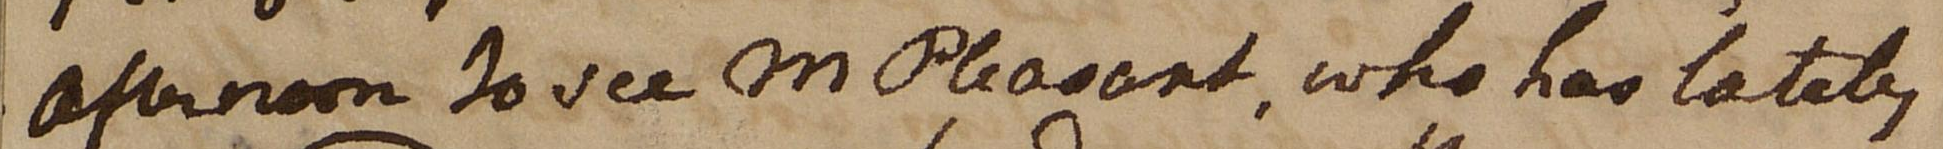afternoon to see M Pleasant, who has lately
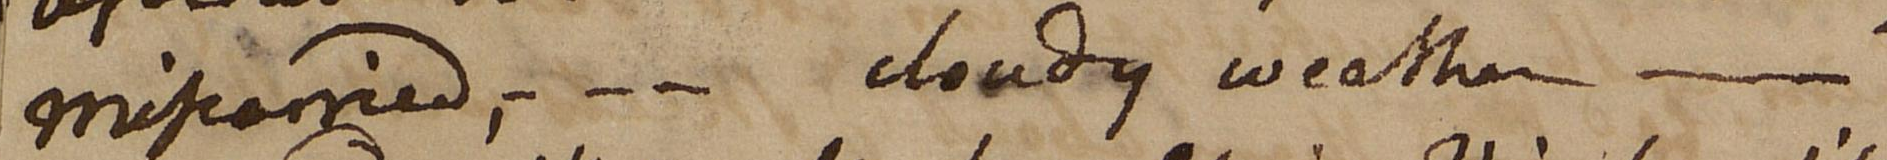miparr'ed.-- cloudy weather-
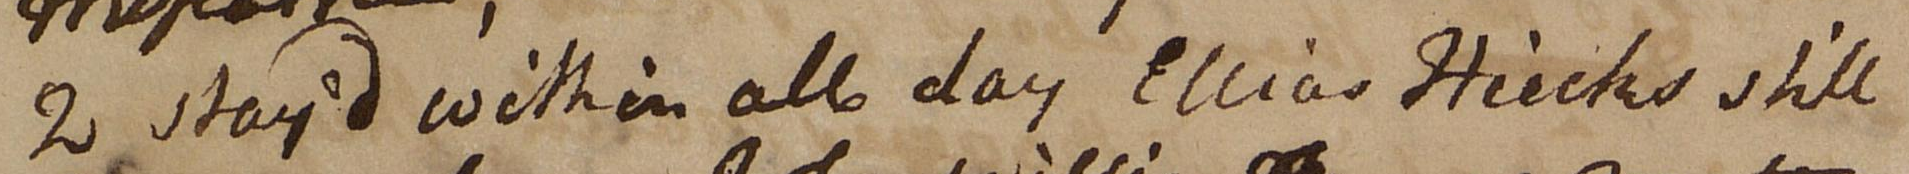2 stay'd within all day Ellias Hicks still
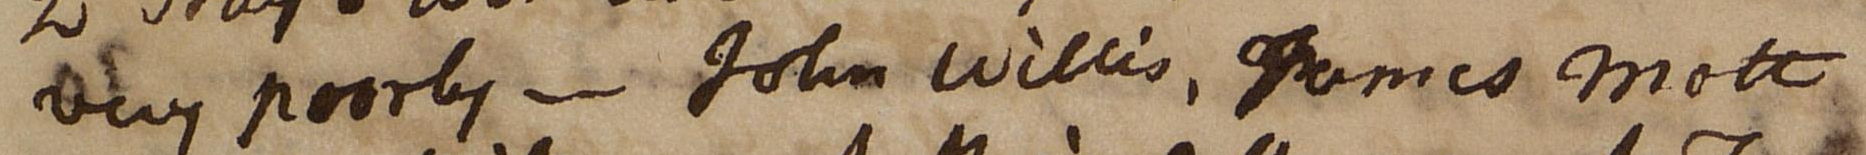very poorly- John Willis, James Mott
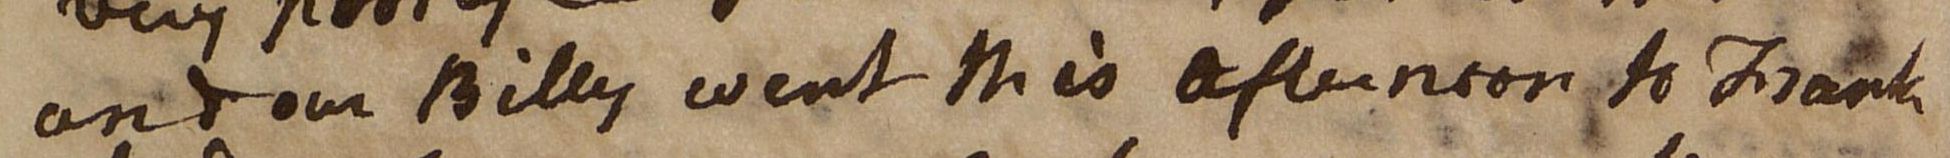and our Billy went this afternoon to Frank
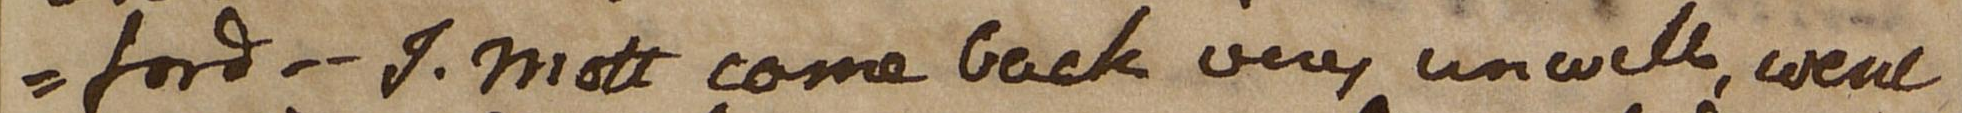-ford-- I. Mott came buck very unwell, went
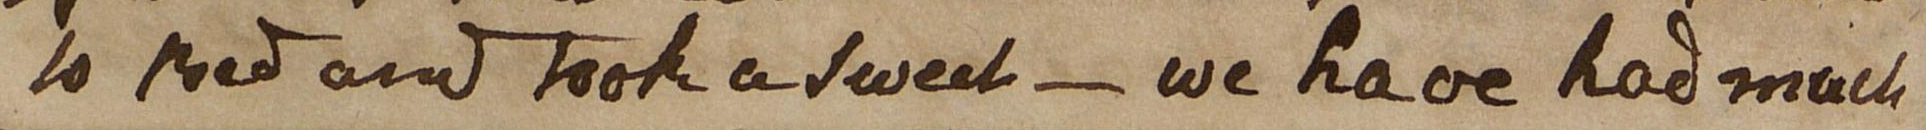to Bed and took a Sweet- we have had much
